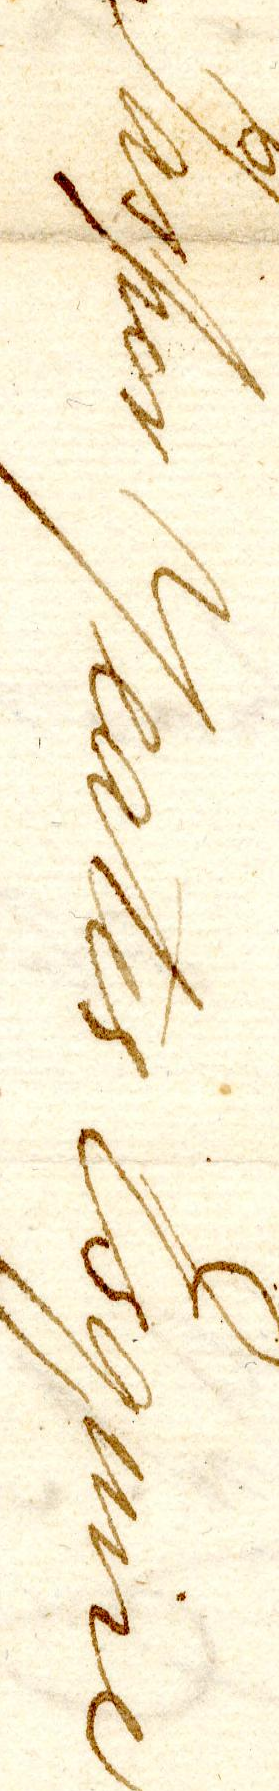Jasper Yeates Esquire
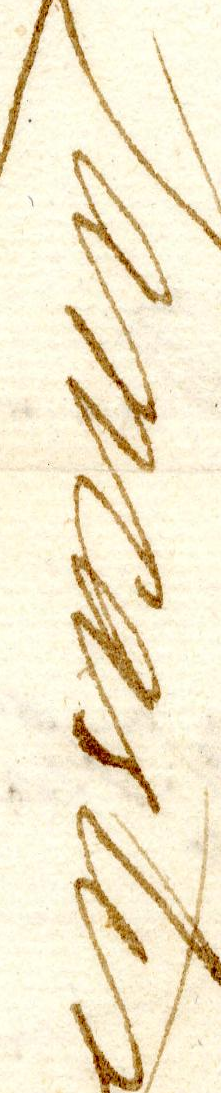Lancaster
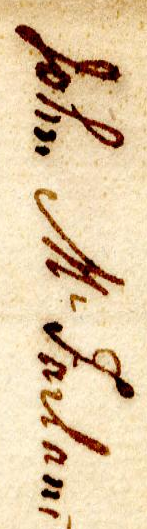John. M^cFarlane
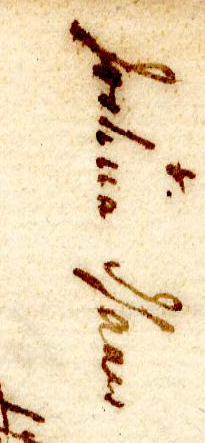Joshua Isaac
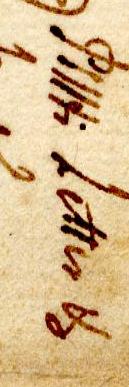Pltff's Letter &
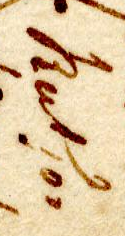Rec^d 100
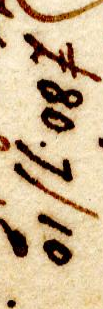£80. 7s10
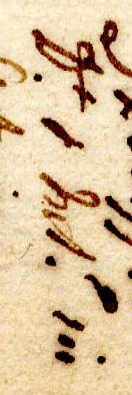D^o. & Int. in
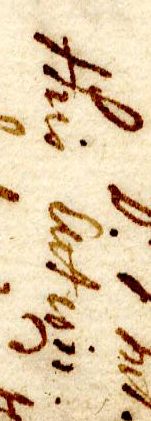this Action
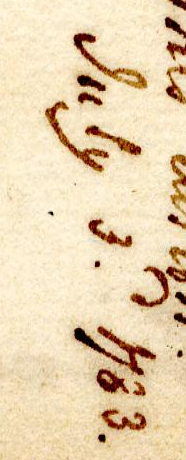July 3^d. 1783
